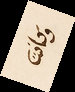وكانت
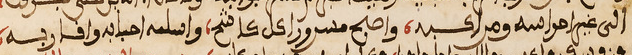الى غير احواسه ومراكبه واصبح مسرور اكل كاشح واسلمه احبابه واقاربه
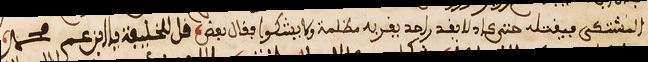المشتكى فيقتله حتى كاد لا يقد راحد يقر به مظلمة ولا يشكوا فقال بعض قل للخليفة يا ابن عمر محمد
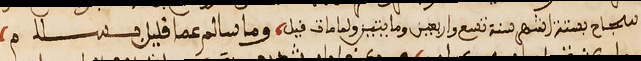سجاح بستة اشهر سنة تسع واربعين وما يتين ولما مات قيل وما سالم عما قليل بسلام
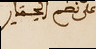على نصم الجتار
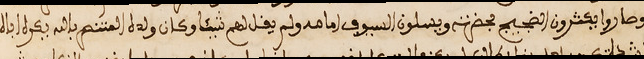وصاروا يكثرون الضجيج بحضرته ويسلون السيوف امامه ولم يقل لهم شئا وكان ولده المتنصر بالله يكره اباه
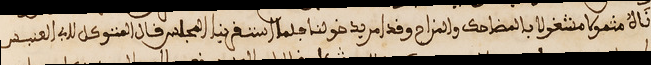ناه مثمولا مشغولا بالمضاحك والمزاح وقد امربد خولنا فلما استقر بنا المجلس قال المتو كل لابى العنبس
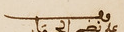قف
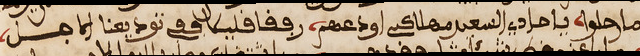ما رحلوا يا حادي السعيد مهلاكنى او دعهم رفقا قليلا ففي توديعنا الاجل
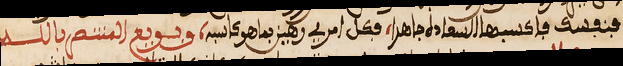فنفسك فاكسبها السعاده جاهرا فكل امري رهين بما هو كاسبه وبويع المنتصر بالله
